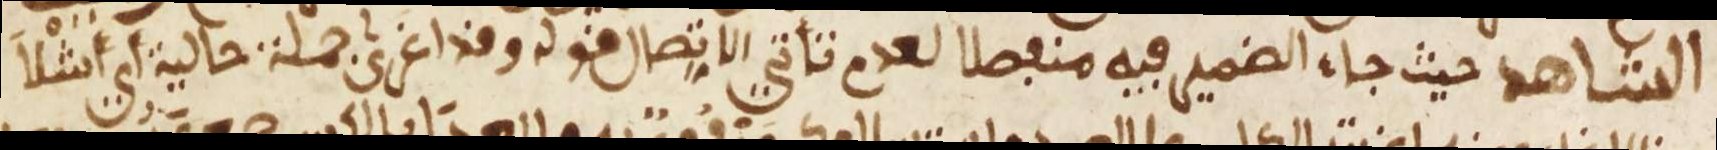الشاهد حيث جاء الضمير فيه منفصلا لعدم تاتي الاتصال قوله و قد اغرى جملة حالية أي أشلا
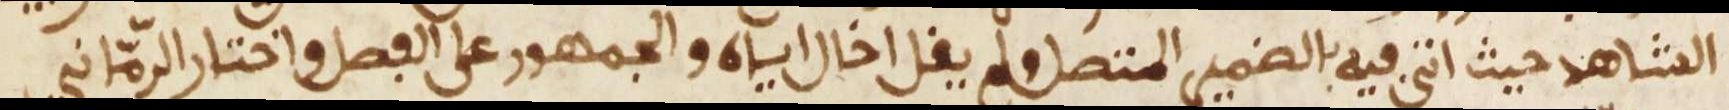الشاهد حيث اتى فيه بالضمير المتصل و لم يقل اخال اياه و الجمهور على الفصل و اختار الرماني
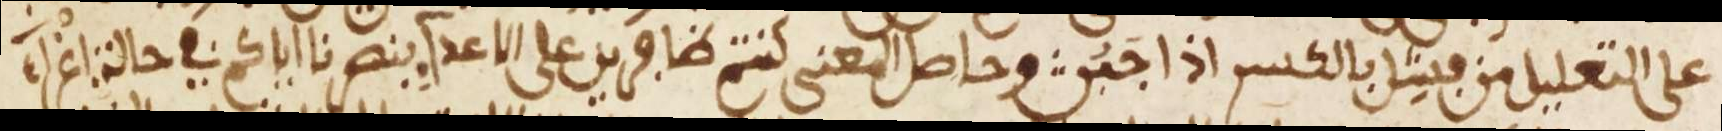على التعليل من فشل بالكسر اذا جبر و حاصل المعنى كنتم ظافرين على الاعداء بنصرنا اياكم في حالة إغراء
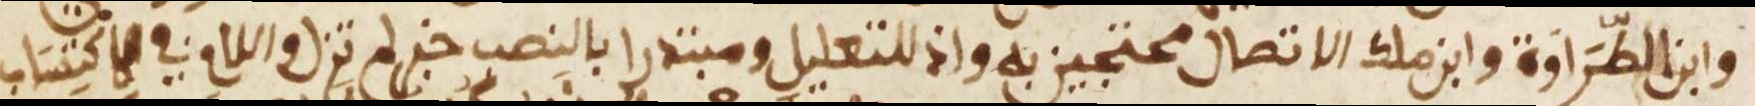و ابن الطراوة و ابن ملك الاتصال محتجين به و اذ للتعليل و مبتدرا بالنصب خبر لم تزل و اللام في الاكتساب
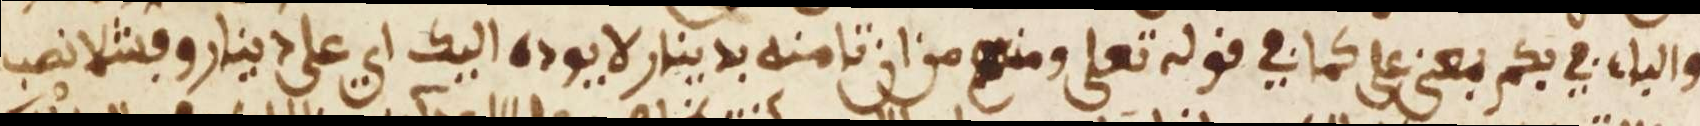و الباء في بكم بمعنى على كما في قوله تعلى و منهم من ان تامنه بدينار لا يوده اليك اي على دينار و فشلا نصب
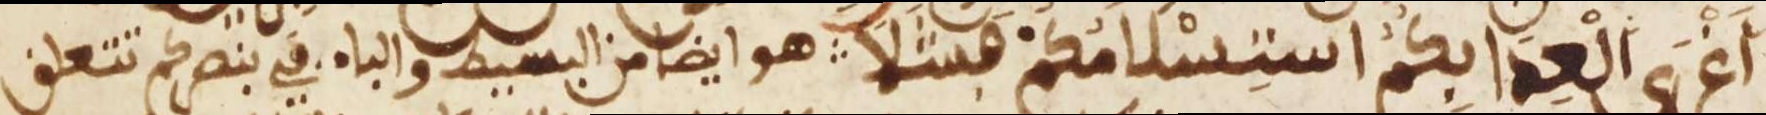اغرى العدا بكم استسلامكم فشلا هو ايضا من البسيط و الباء في بنصركم تتعلق
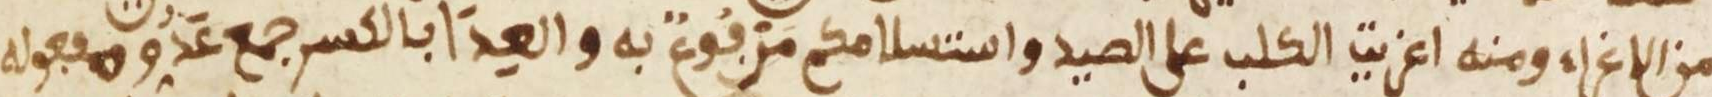من الاغراء و منه اغريت الكلب على الصيد و استسلامكم مرفوع به و العدا بالكسر جمع عدو مفعوله
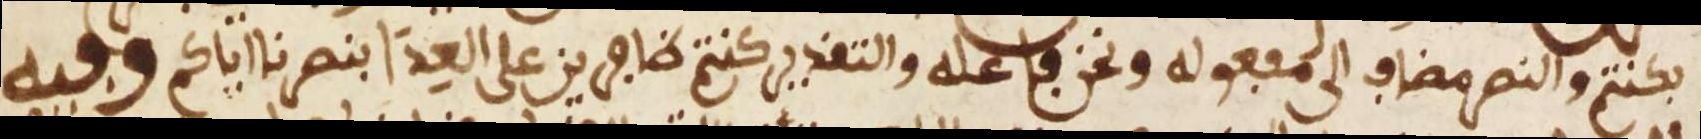بكنتم و النصر مضاف الى مفعول له و نحن فاعله و التقدير كنتم ظافرين على العدا بنصرنا اياكم و فيه
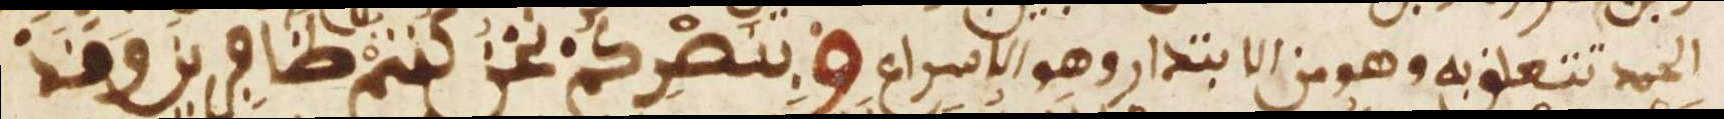الحمد تتعلق به و هو من الابتكار وهو الاسراع و بنصركم نحن كنتم ظافرين و قد
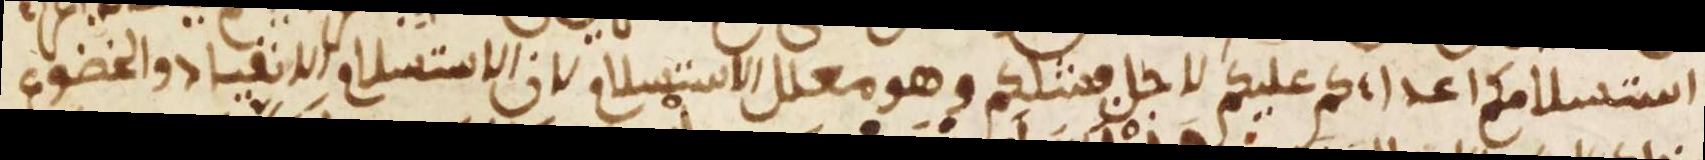استسلامكم اعداءكم عليكم لاجل فشلكم و هو معلل الاستسلام لان الاستسلام الانقياد و الخضوع
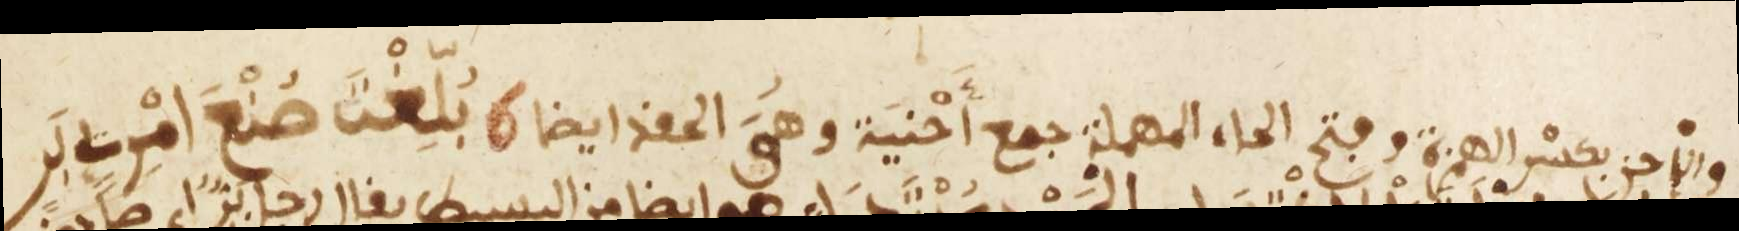و الاحن بكسر الهمزة و فتح الحاء المهملة جمع أحنية و هو الحقد ايضا بلغت صنع امرئ بر
